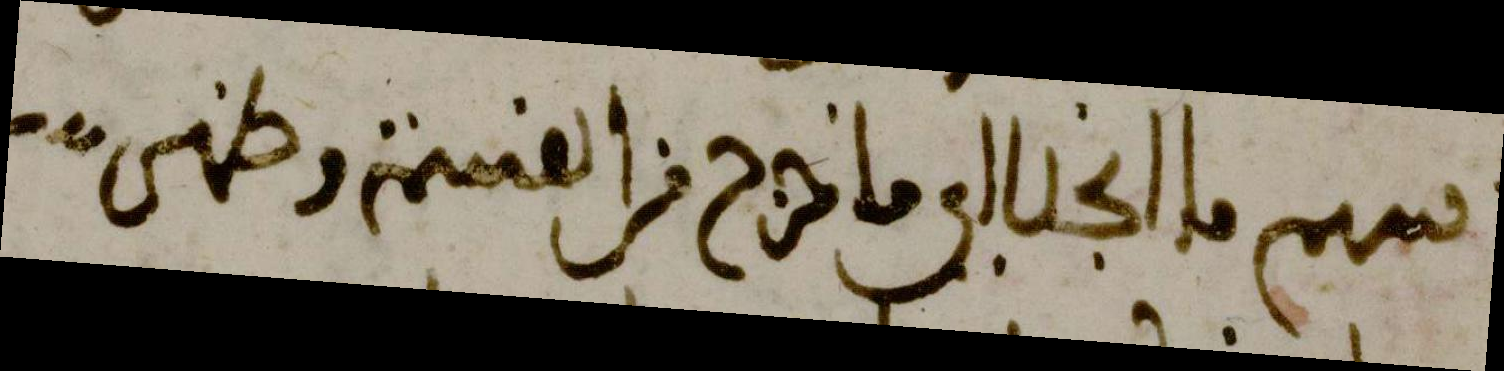سهم ما انجلا اي ما خرج من القسمة وظهر
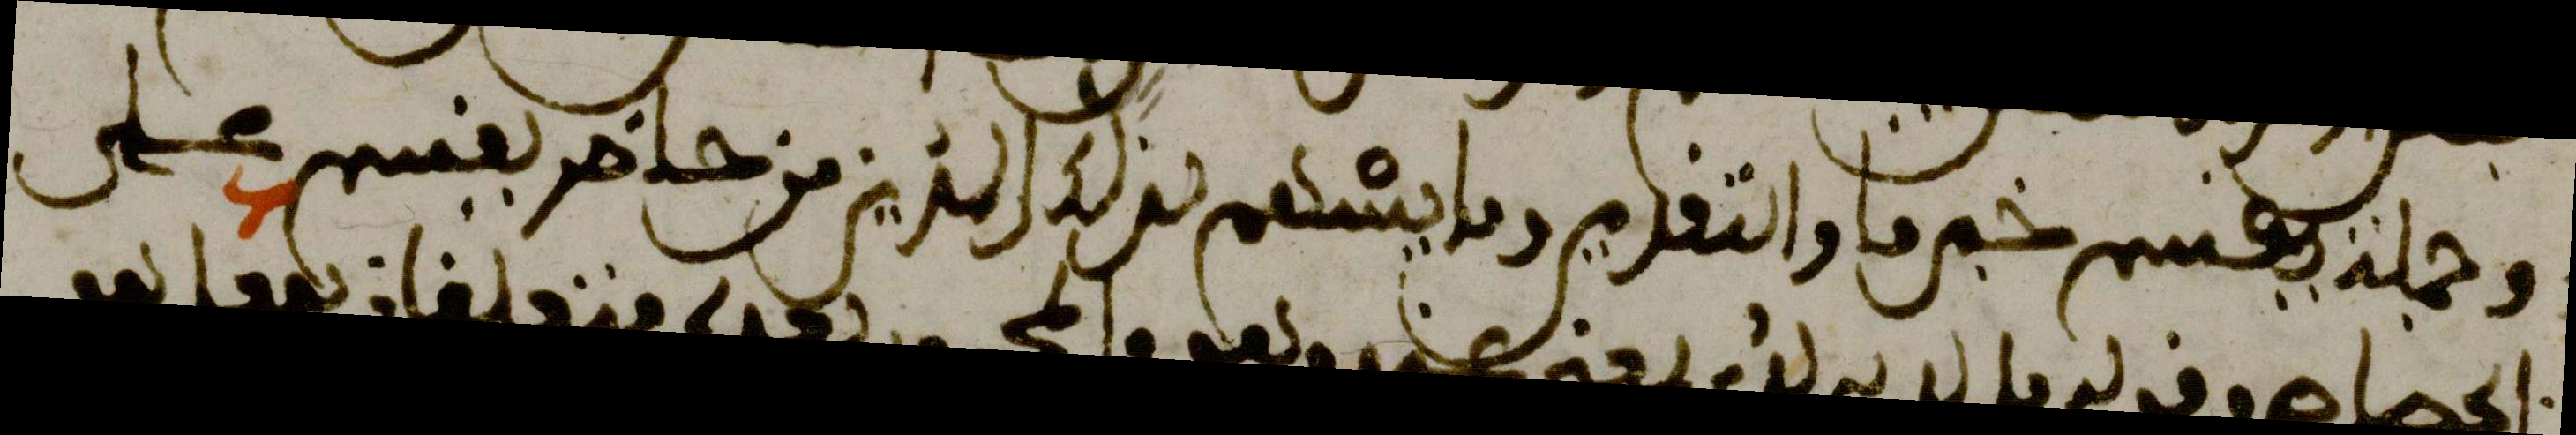وحملة يقسم خبر ما والتقديم وما يسهم لذلك المدين من حاضر يقسم على
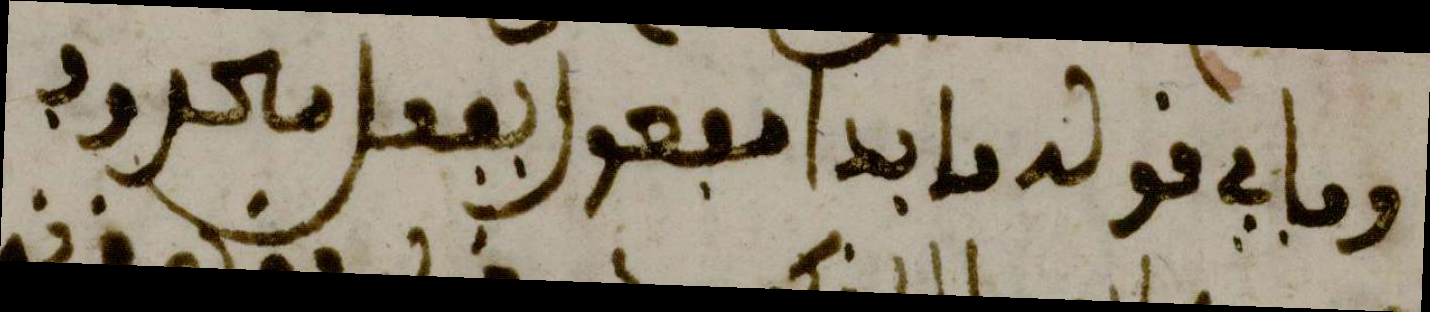ومافي قوله ما بدا مفعول بفعل محدوف
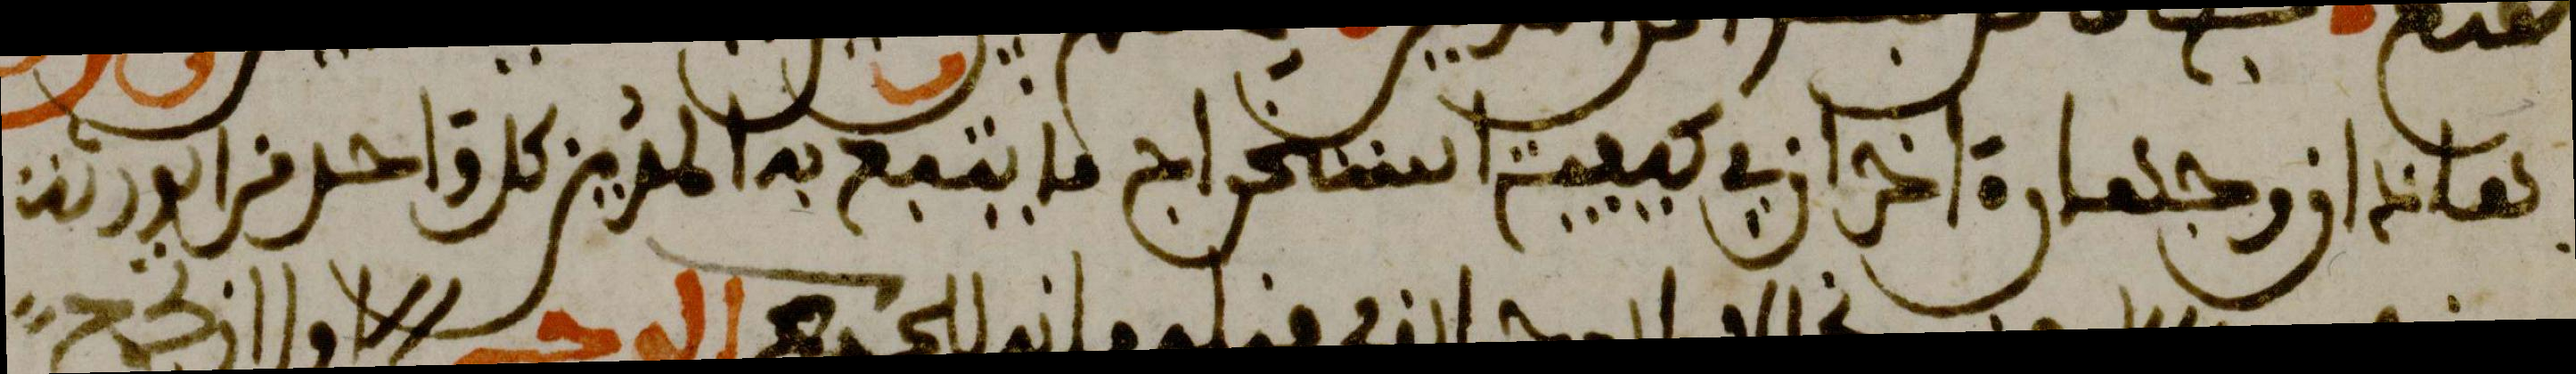هاذان وجها ءاخران في كيفية استخراج ما يتبع به المدين كل واحد من الورثة
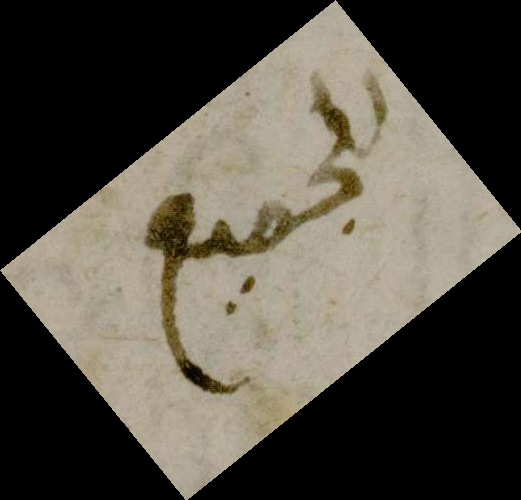للجميع
